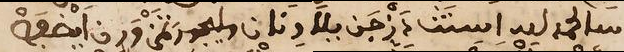سالحمد لله اسنث دزجن يلا ونان # تمزورن ايضفص
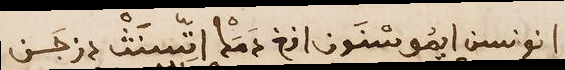ميديسنث يغر الكول تمزورن ايضفص يسنفيلل
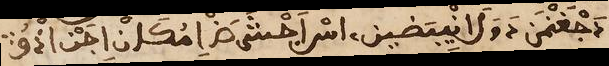دجمغنمن دول انيبضين ءاس اجشرض امكان اجن اذو
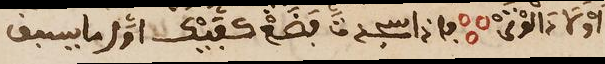اولا د الوتر فاذا سجدت فضع كفيك اول ما يسبق
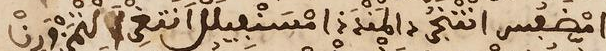امضفس انتنجر د المندذ امسنفيلل انتغر التمزورن
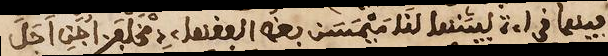فيهما قراءة لبينها لنا ميمسن بعض الفقهاء د مخلفن اجن اجل
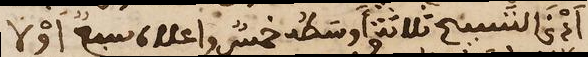ادنى التسبيح ثلاثة واوسطه خمس واعلاه سبع اولا
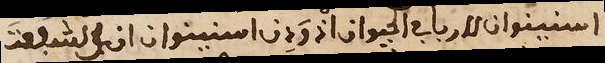اسنينوان لا ربا في الحيوان اذودن اسنينوان ان الشفعة
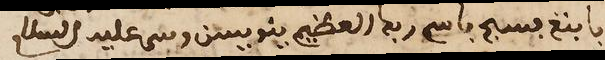بابنغ فسبح باسم ربك العظيم ينويسن وسر عليه السلام
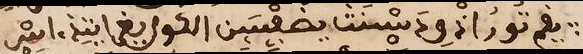يقم تور اذودسنت يضفسن الكول يغرايتذءاس ت
